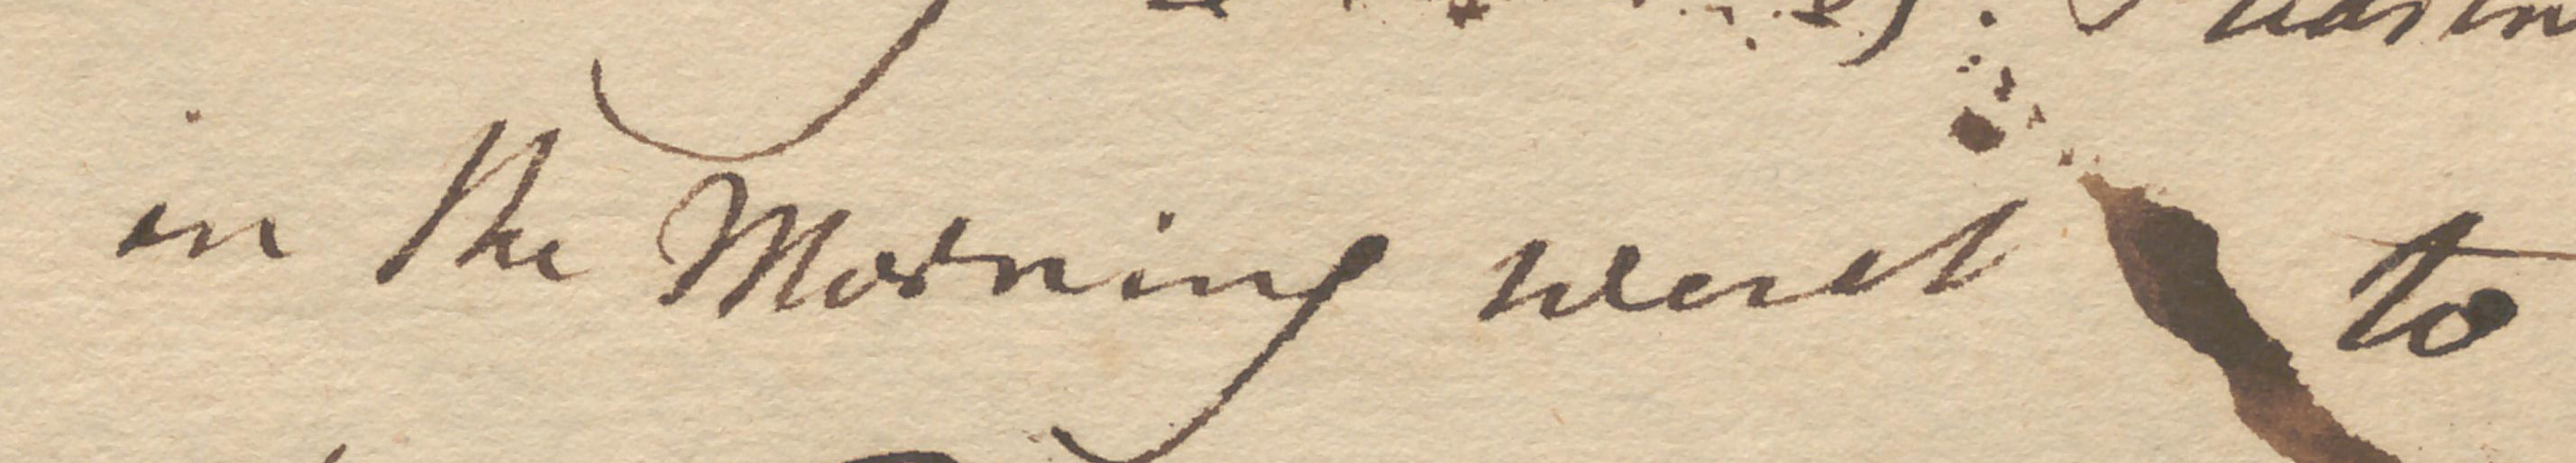in the Morning went to
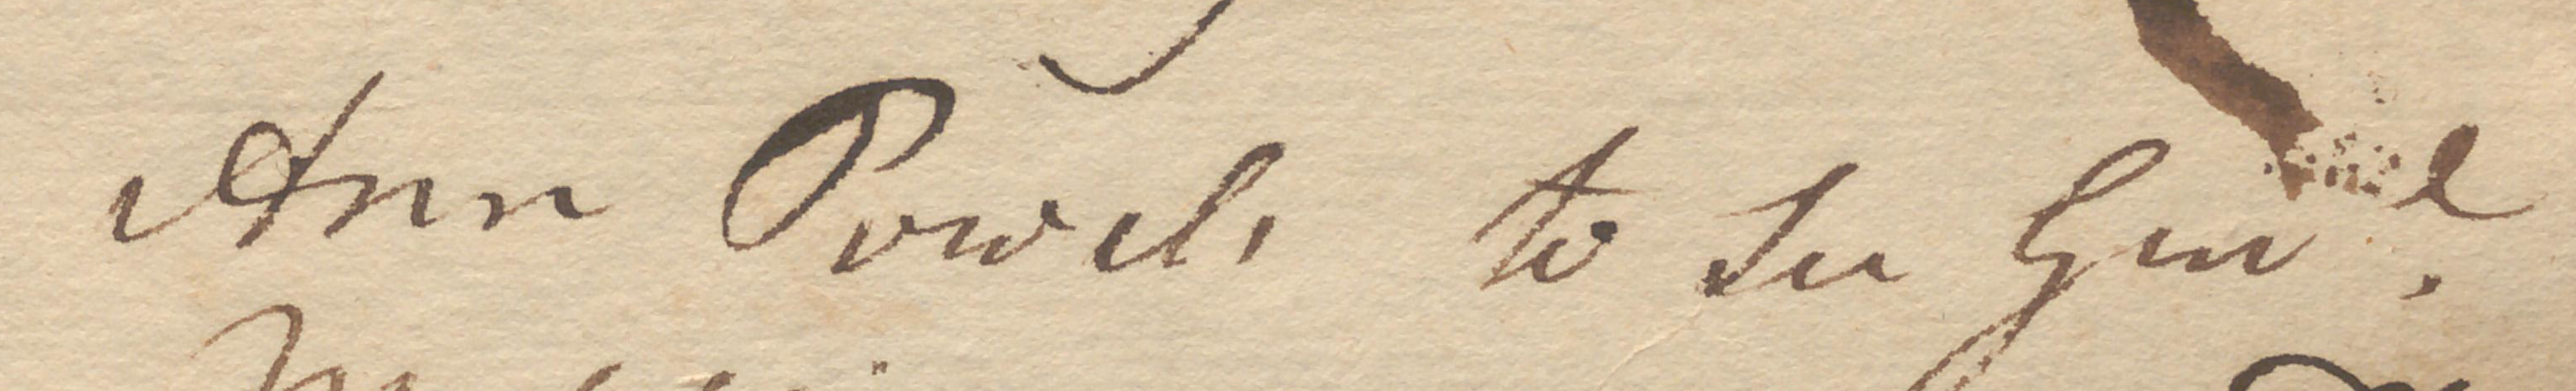Ann Powels to see Gen^l
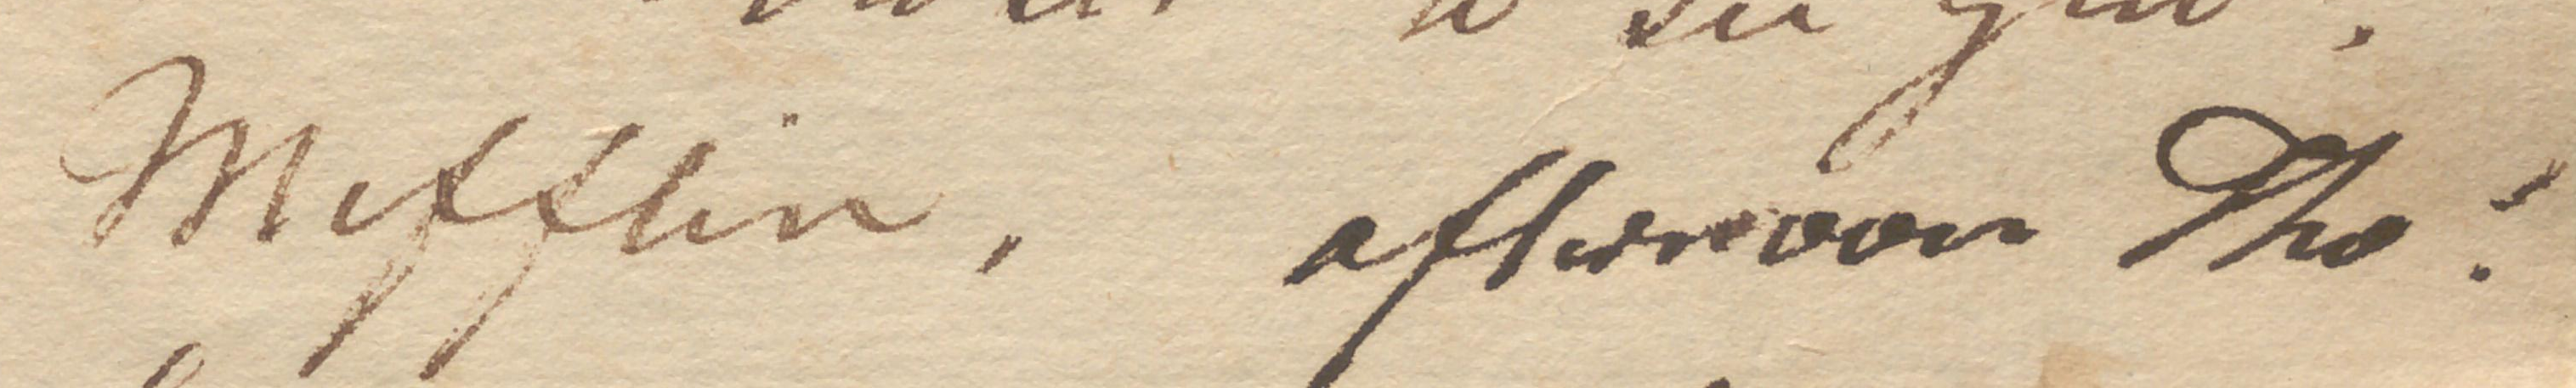Milllin, affernoon Tho^s.
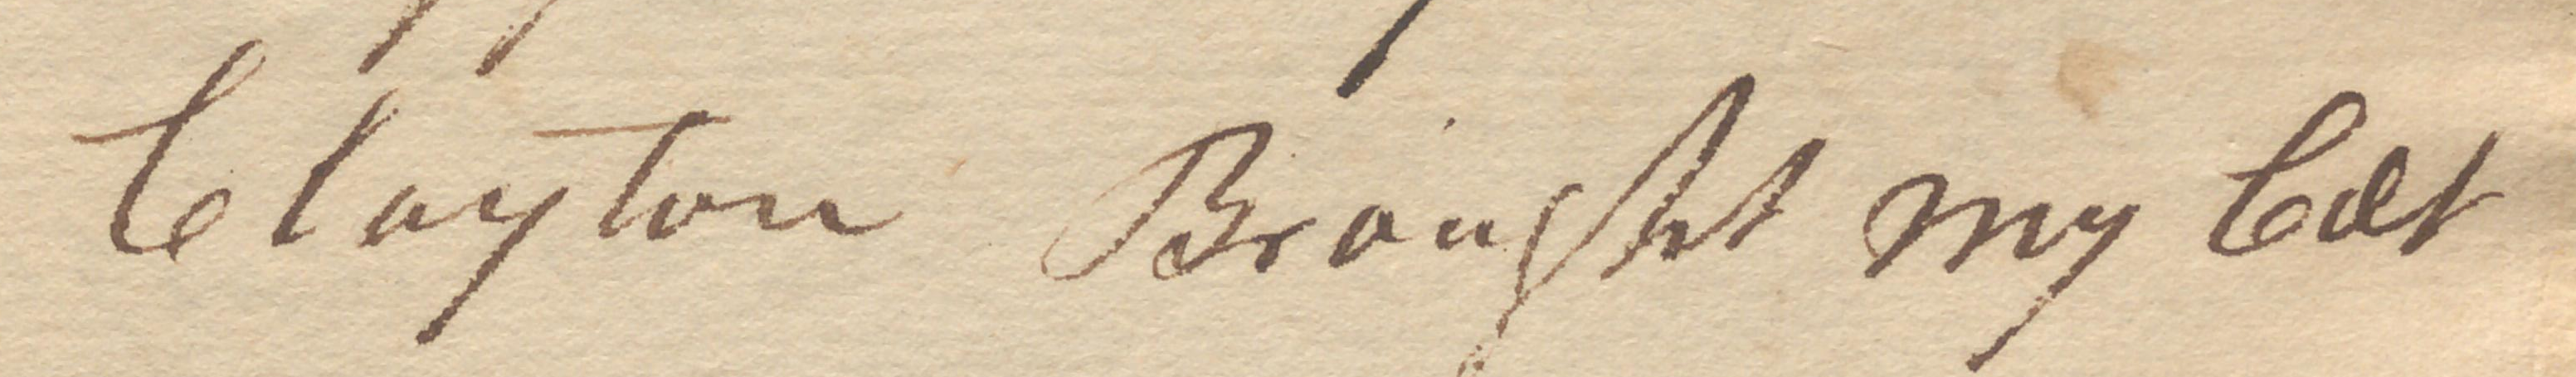Clayton Brought my Cat
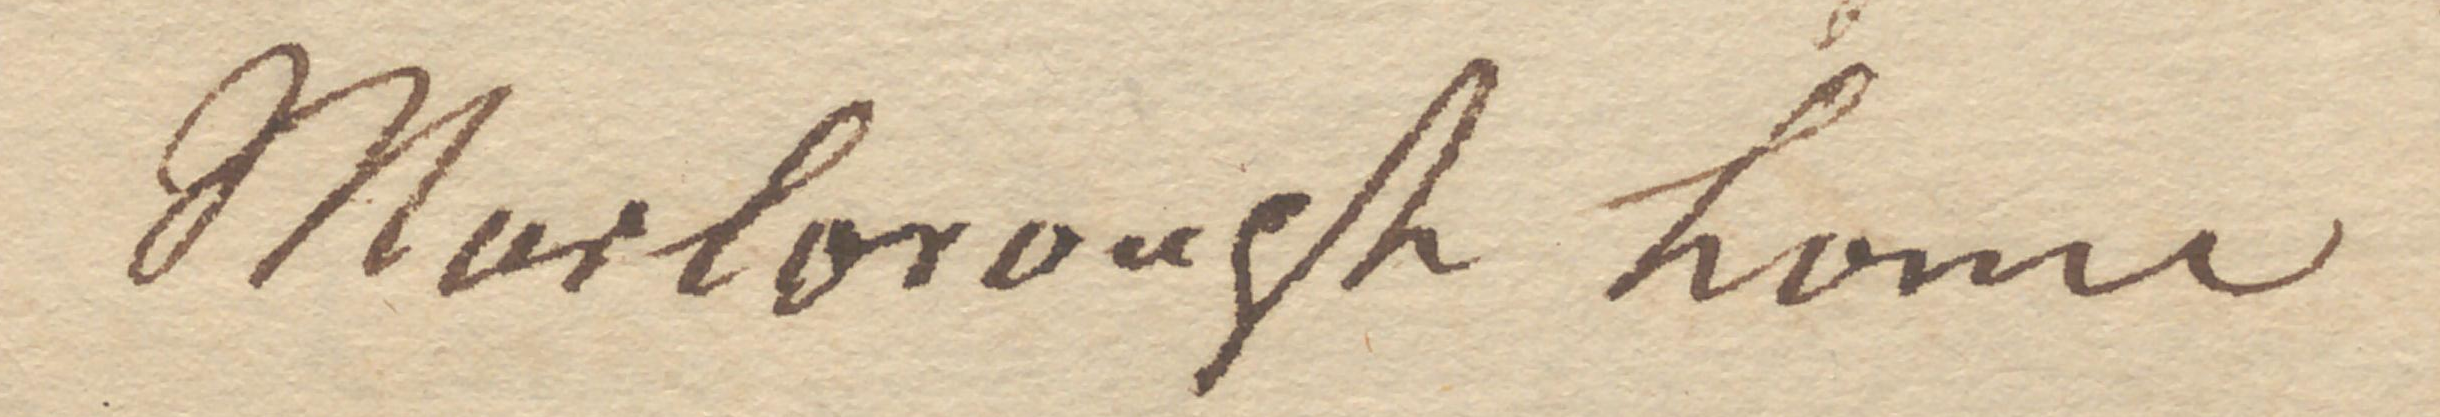Marlorough home
